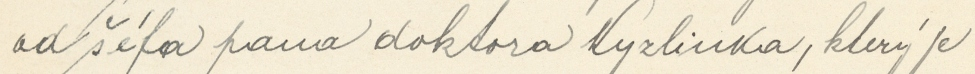od šéfa pana doktora Kyzlinka, který je
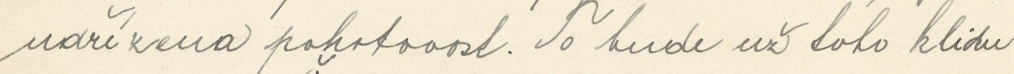nařízena pohotovost. To bude už toho klidu
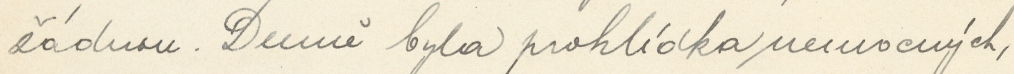žádnou. Denně byla prohlídka nemocných,
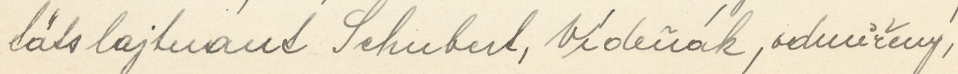täts lajtnant Schubert, Vídeňák, odměřený,
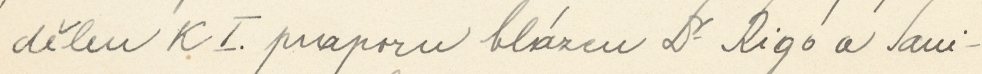dělen k I. praporu blázen Dr Rigó a Sani-
